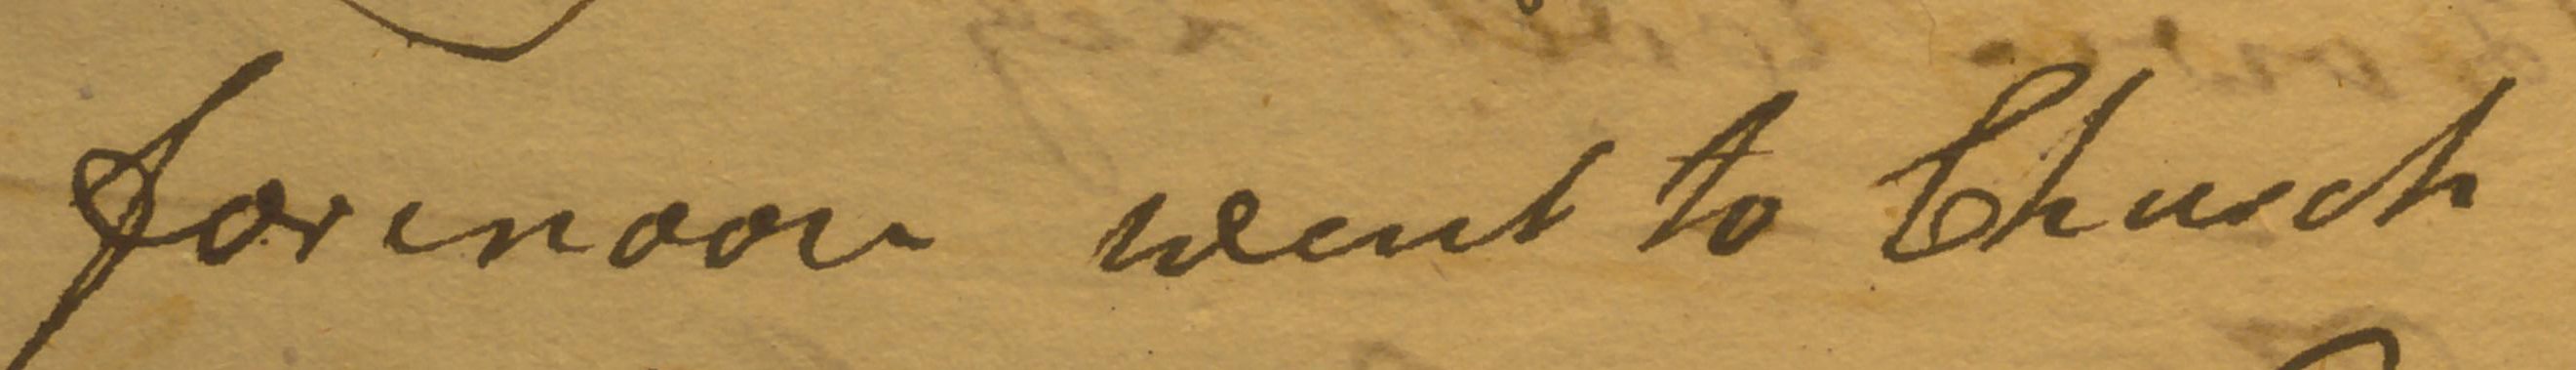forenoon went to Church
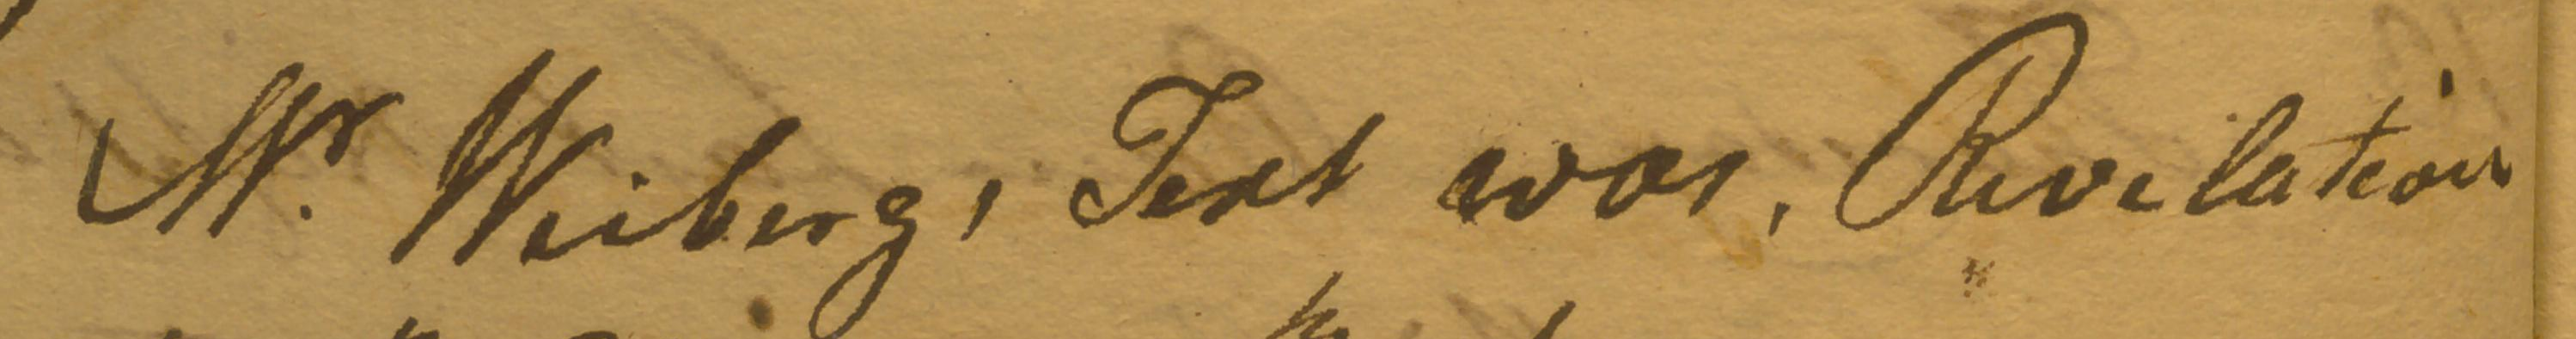M^r. Weibergs Text was, Revelation
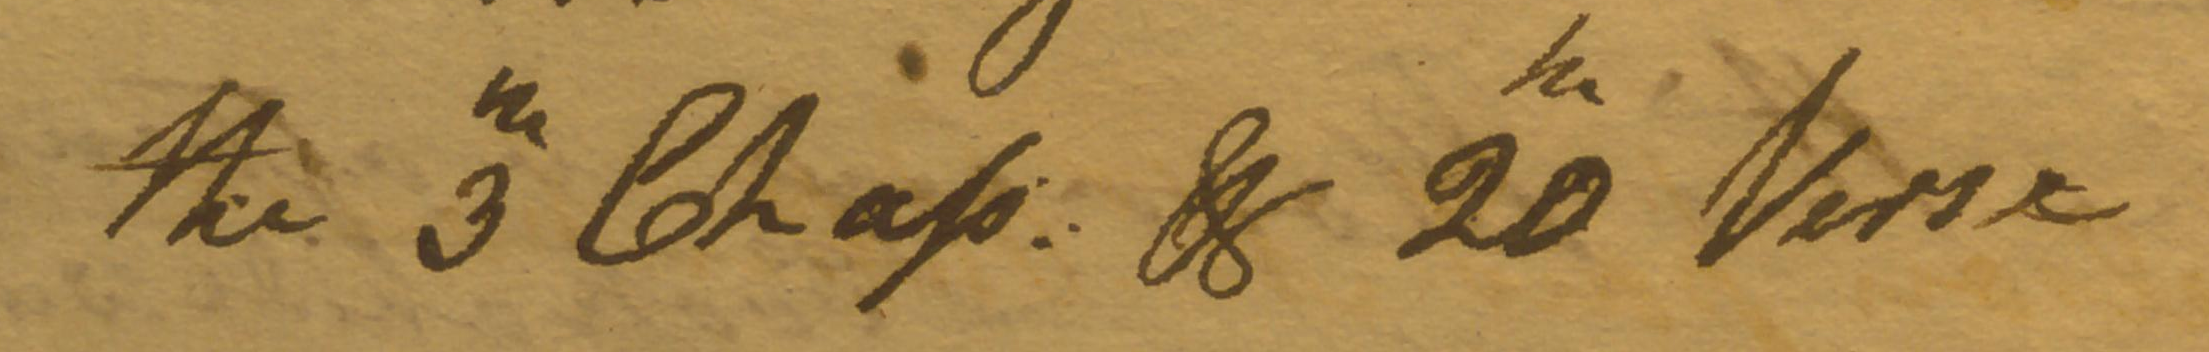the 3^th Chap. & 20^th Verse
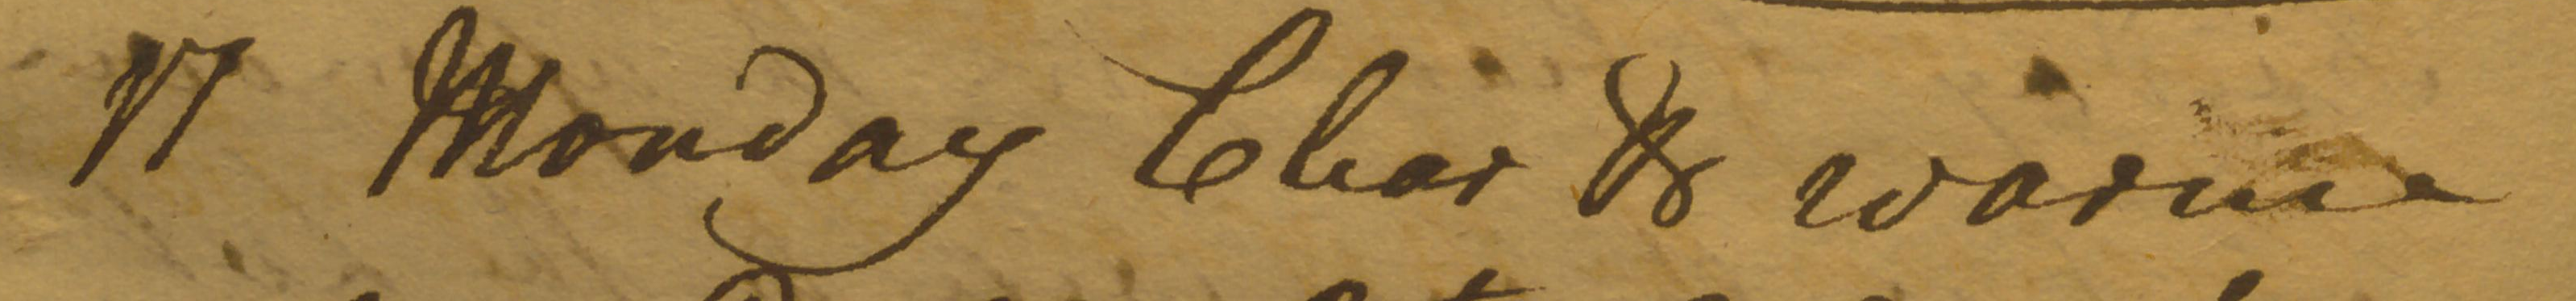17 Monday Clear & warme
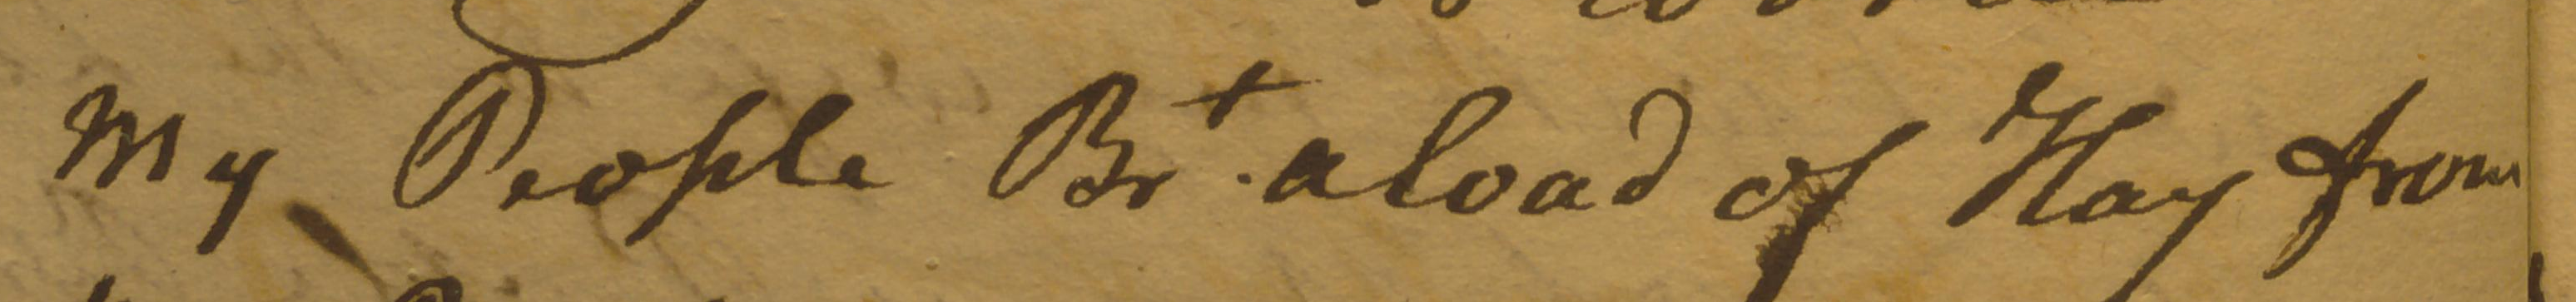My People Br^t. a load of Hay from
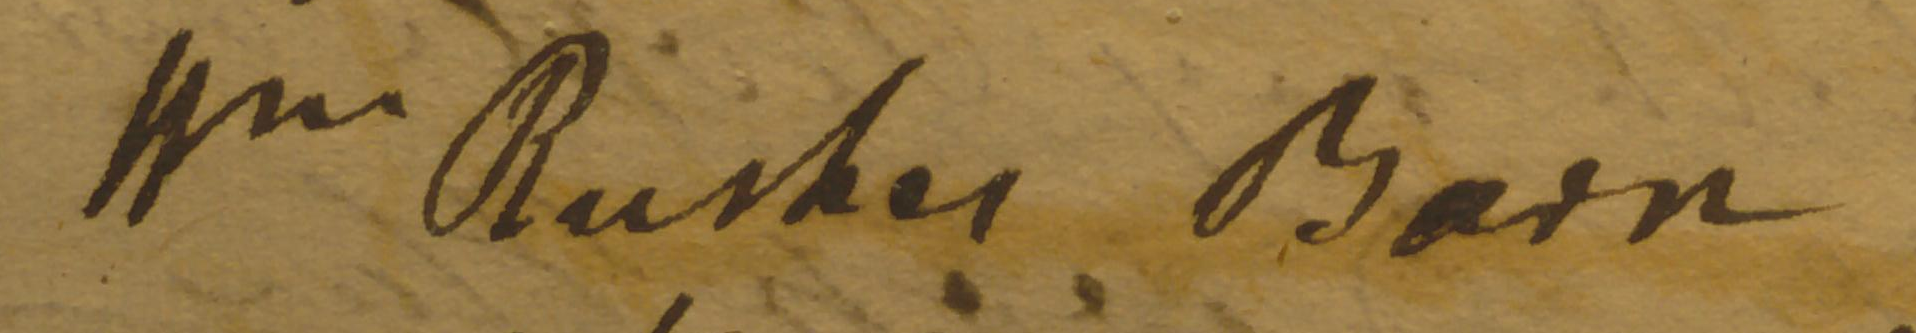W^m Rushes Barn
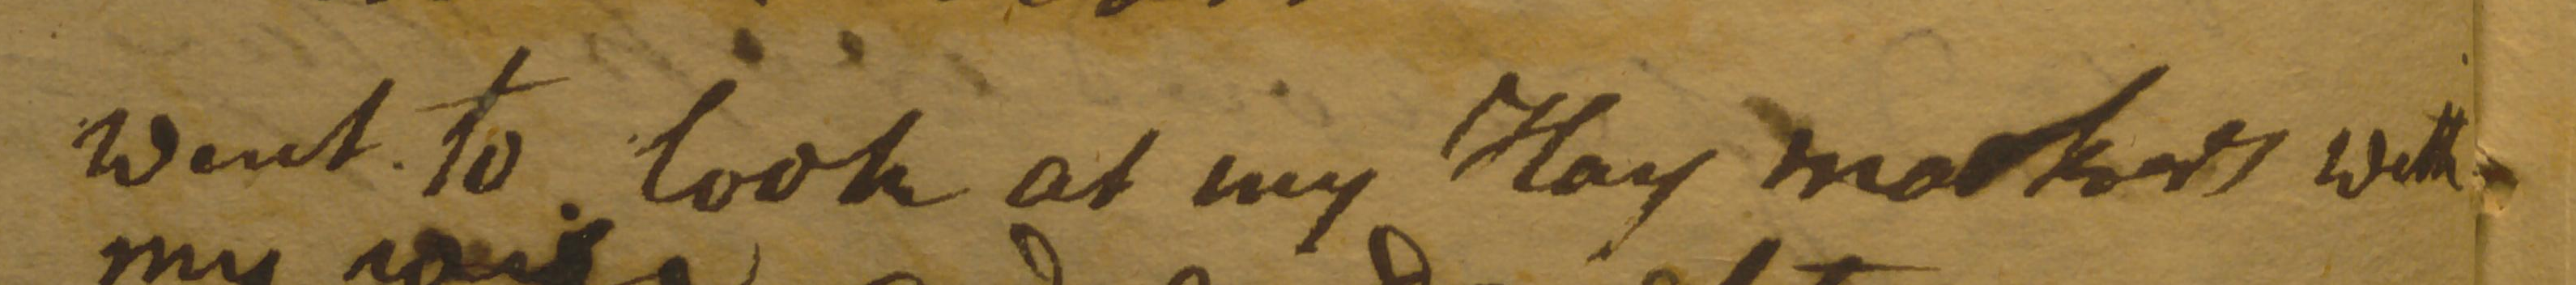went to look at my Hay markers with
